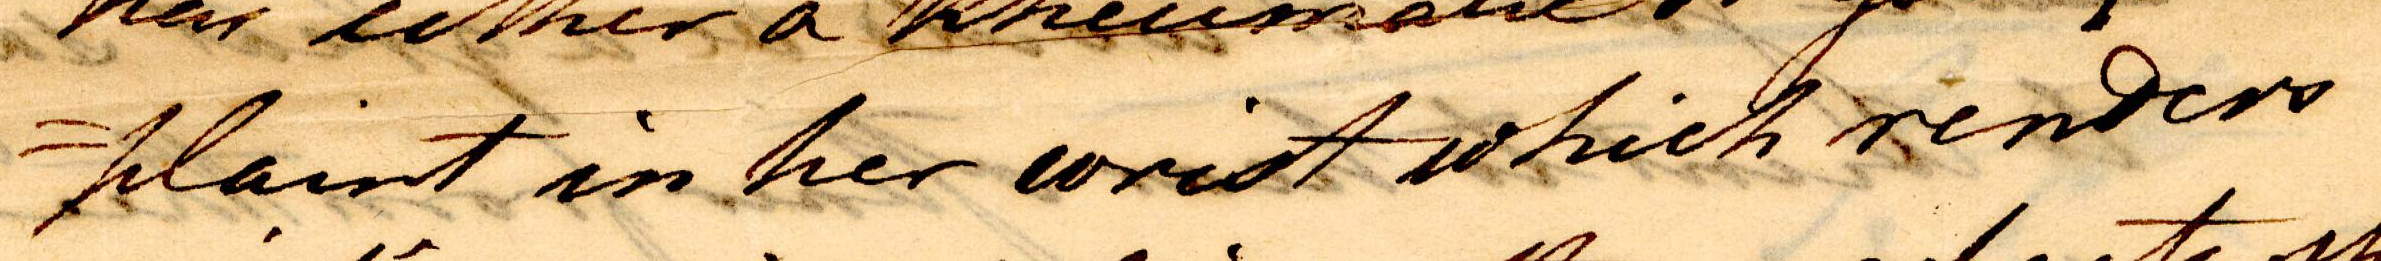-plaint in her wrist which renders
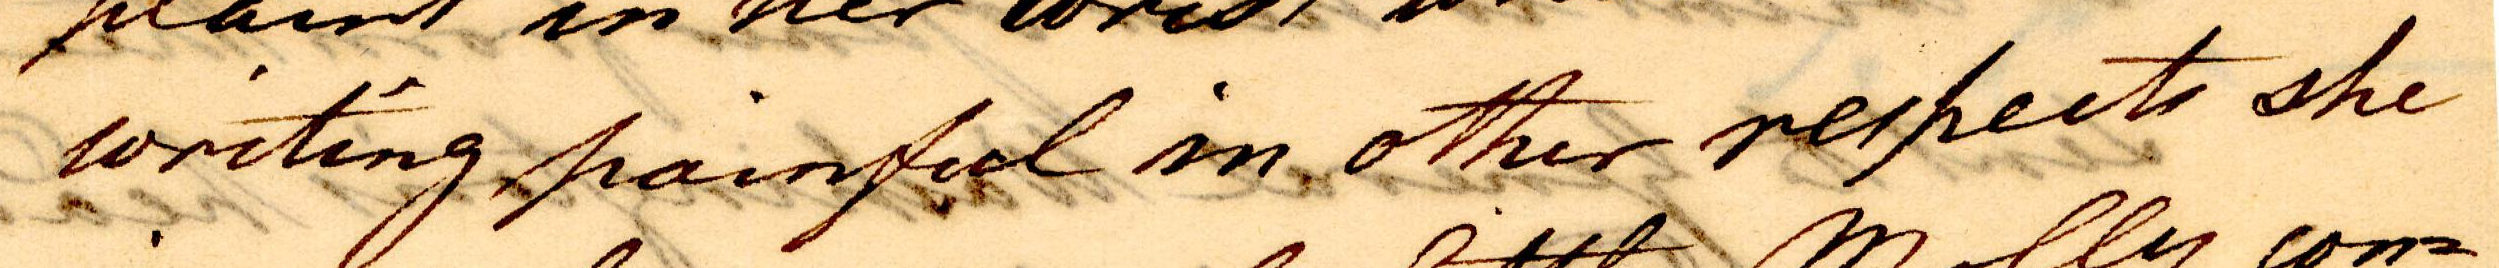writing painful in other respects she
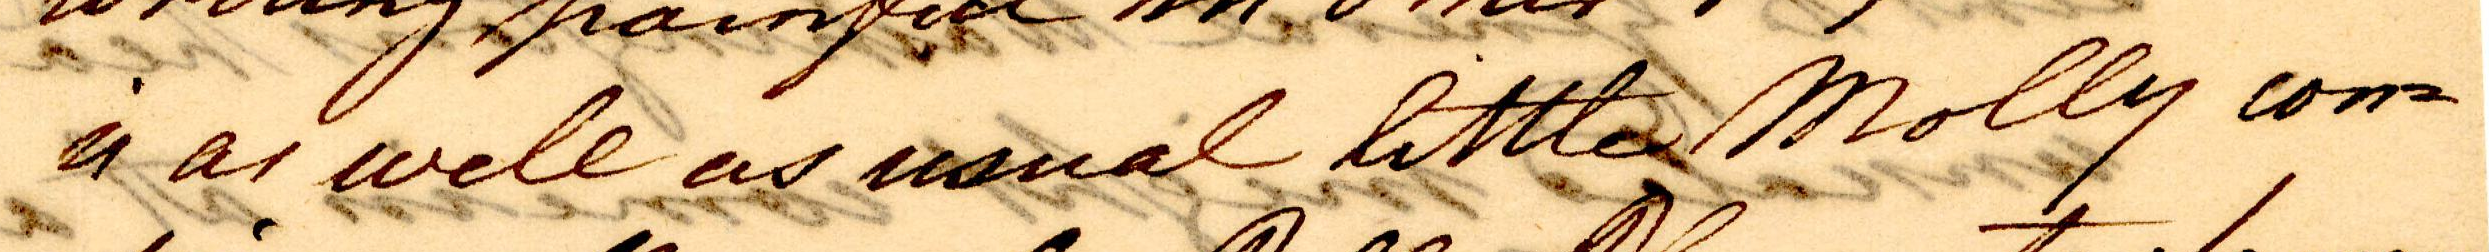is as well as usual little Molly con-
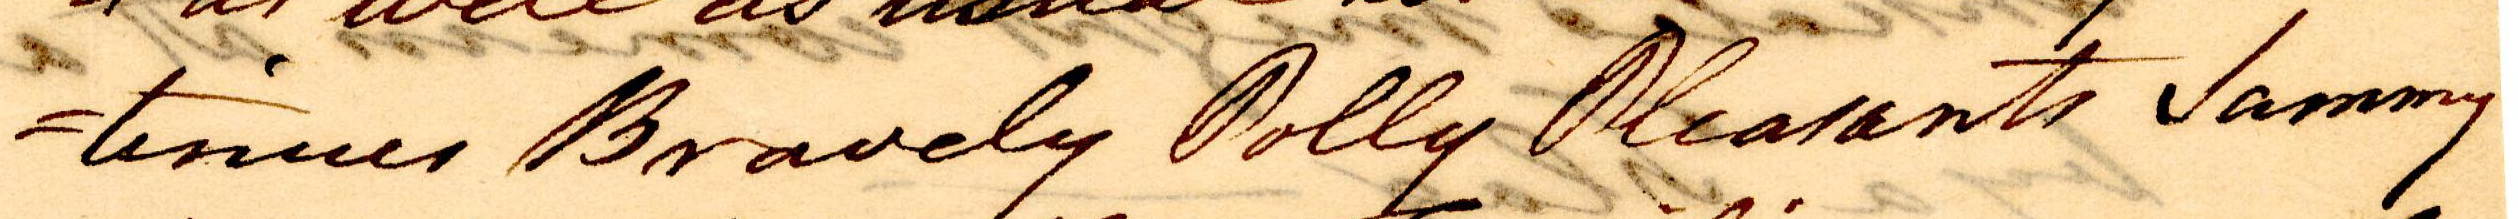-tinues Bravely Polly Pleasants Sammy
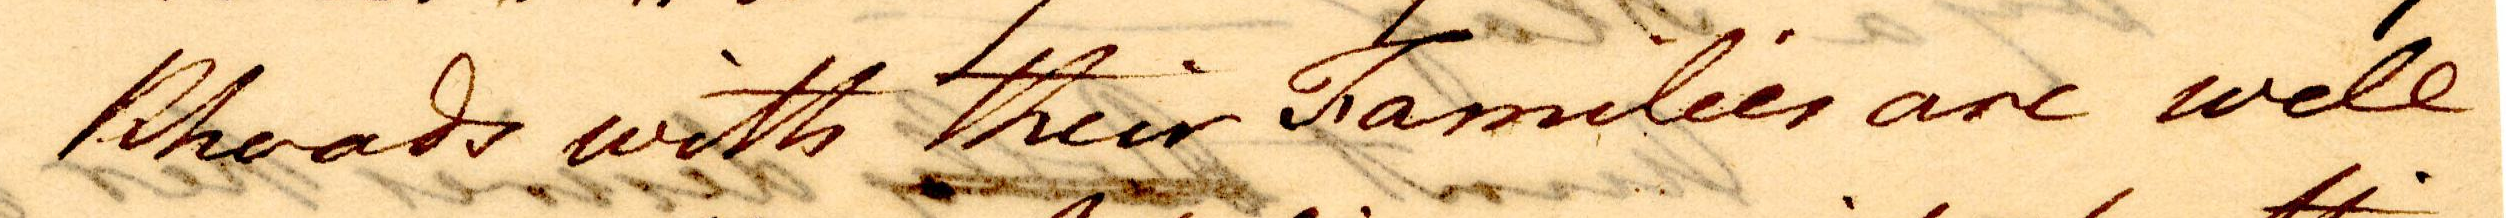Rhoads with their Families are well
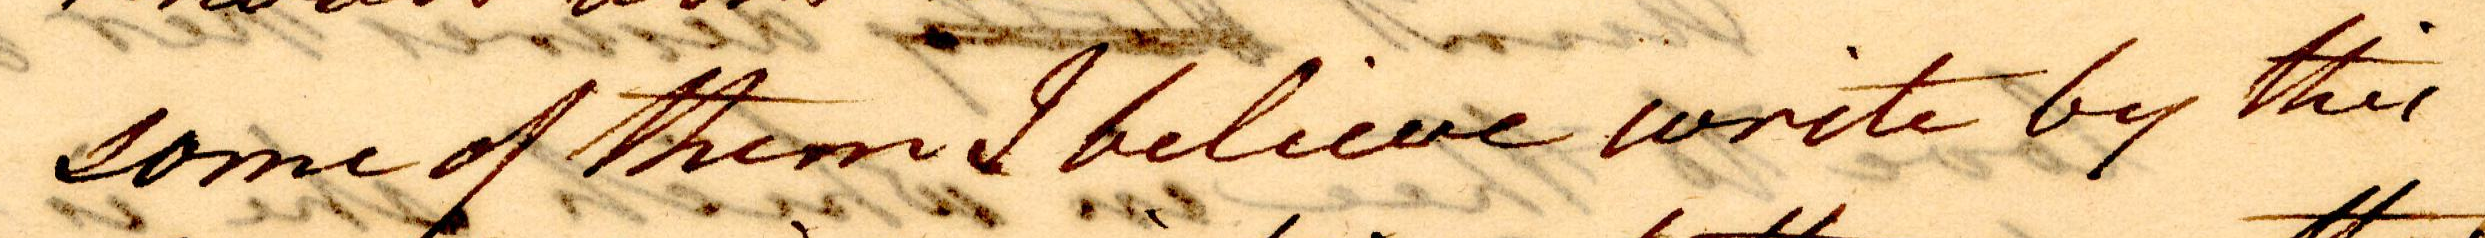some of them I believe write by this
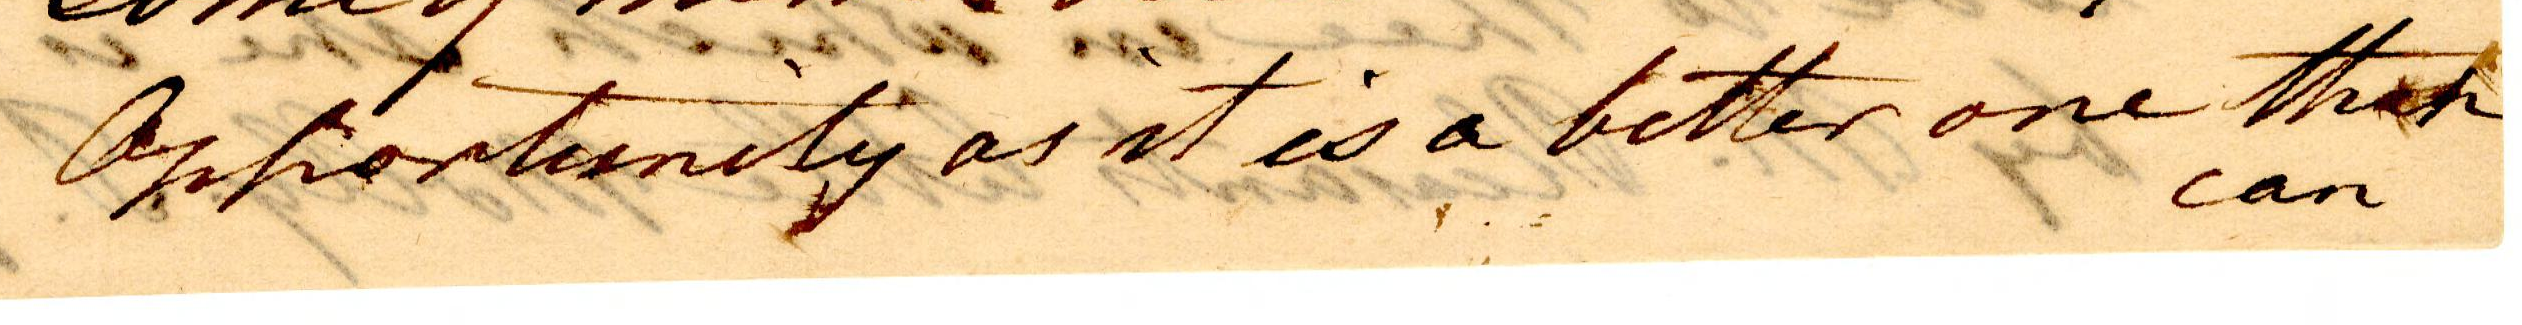Opportunity as it is a better one than
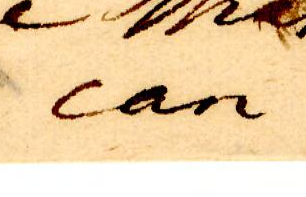can
